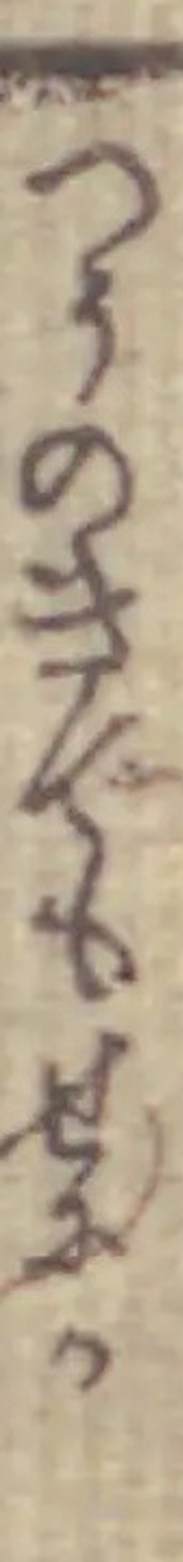つうのきでもせにか
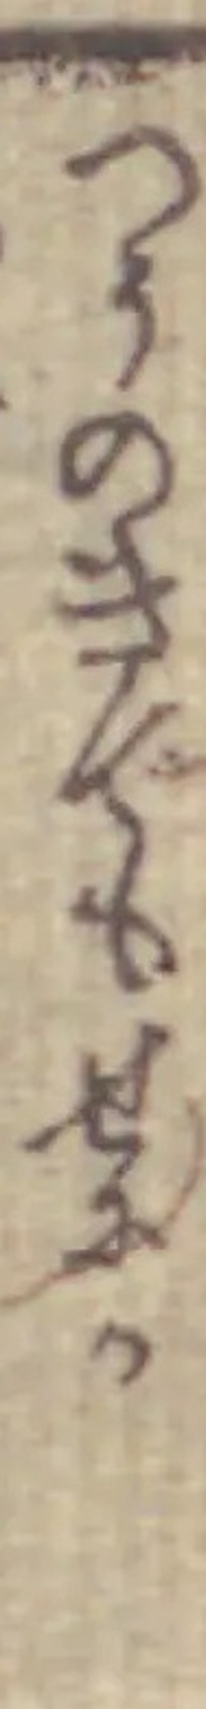つうのきでもせにか
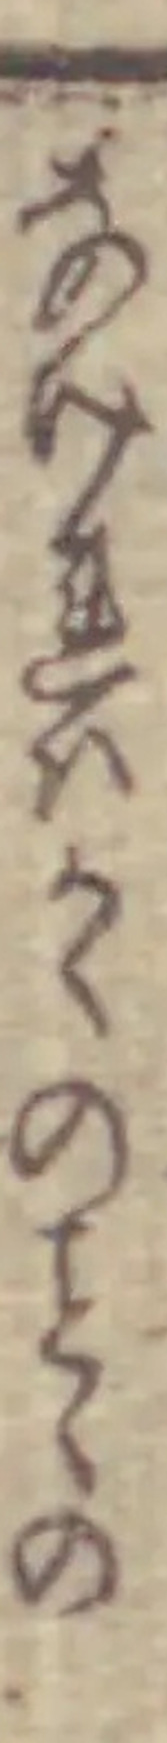なけれはかくのことくの
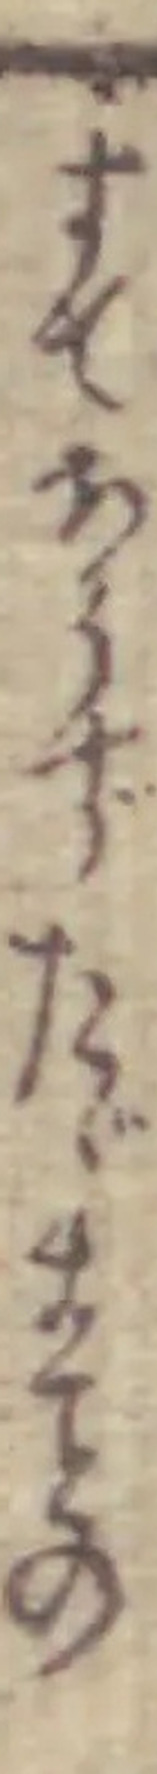すてほうずたゞまことの
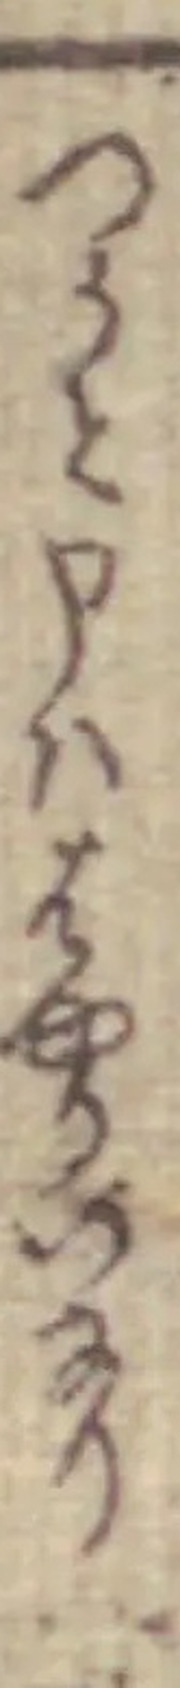つうと申ははやりいなり
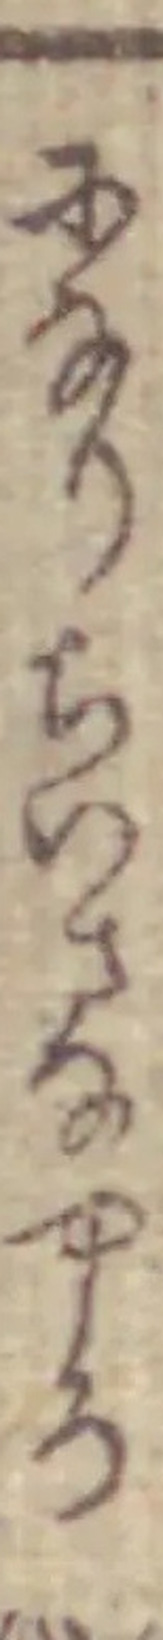になりちいさなやしろ
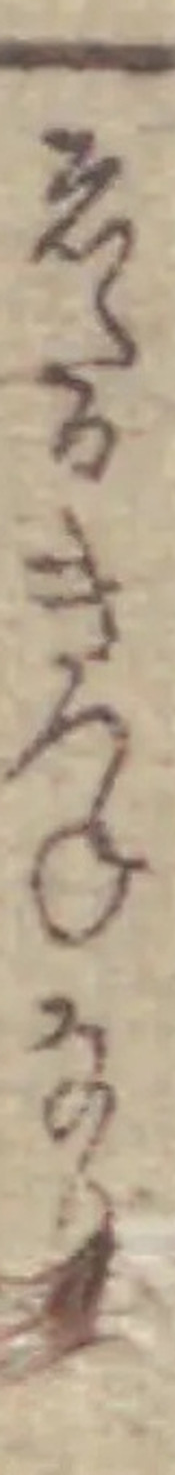ゑたるきつねなり
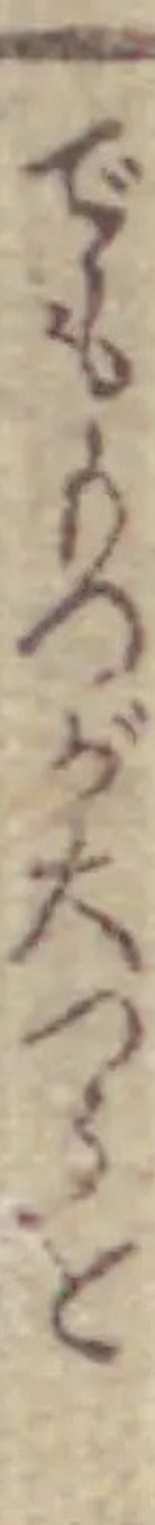でもつが大つうを
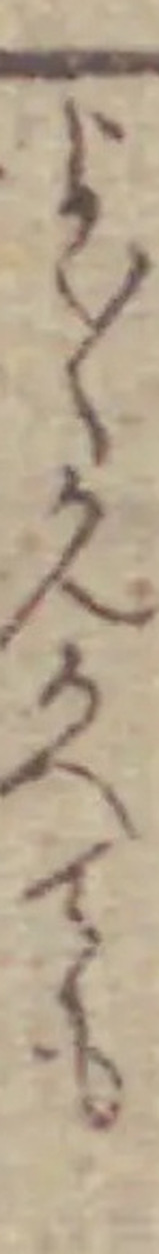よく〳〵かんかへても
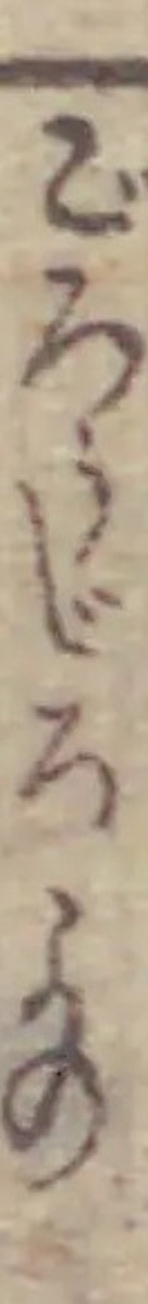ごろうじろよの
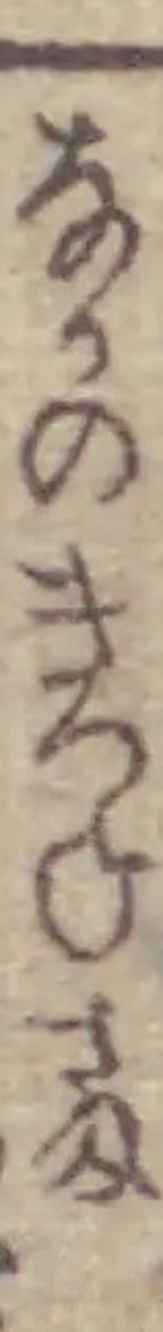なかのきつねさま
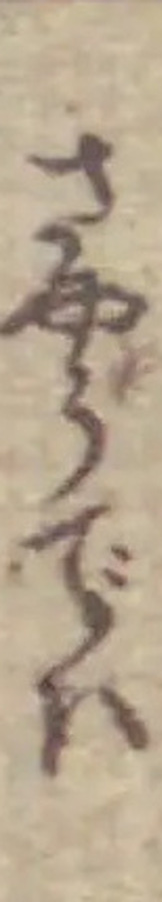さやうでは
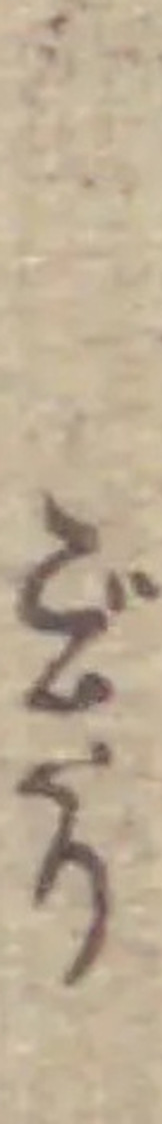ごさり
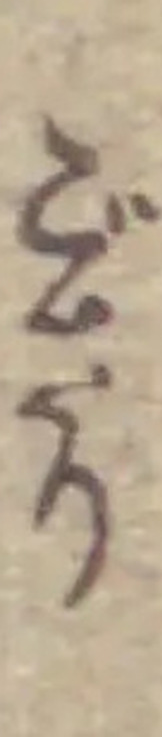ごさり
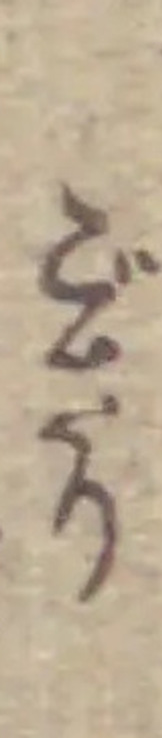ごさり
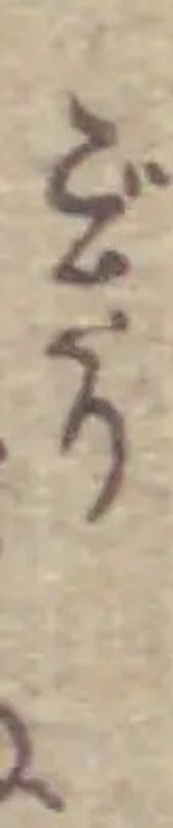ごさり
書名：夜野中狐物 2巻
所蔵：国立国会図書館 National Diet Library, JAPAN
